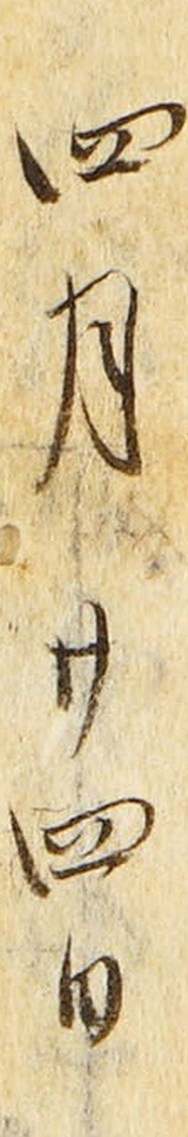四月廿四日
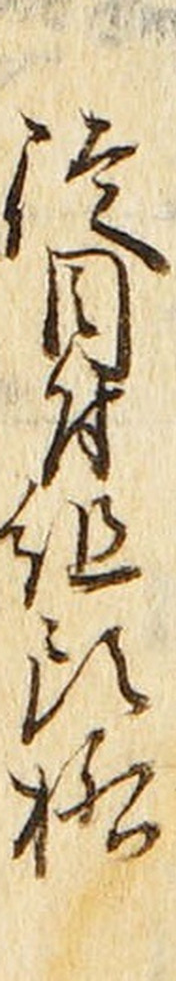徒目付組頭様
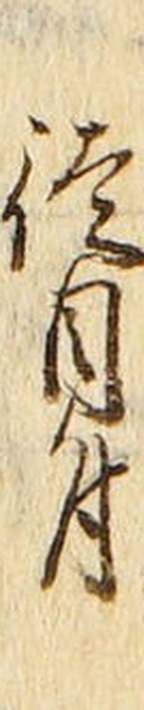徒目付
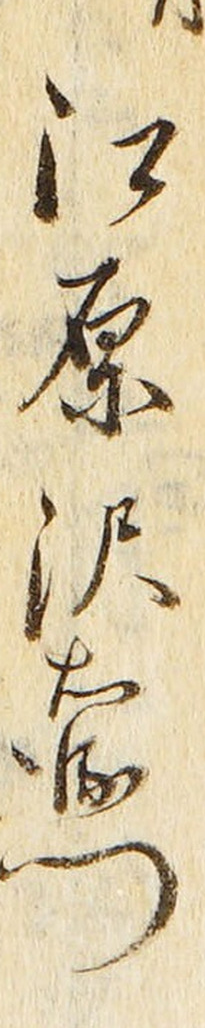江原沢右衛門
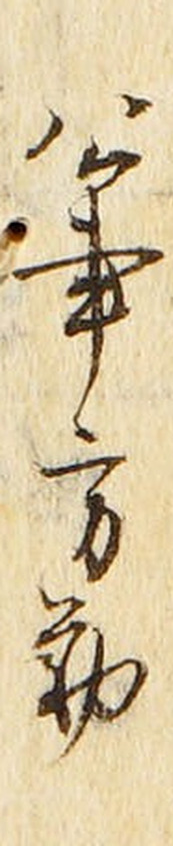公事方勅
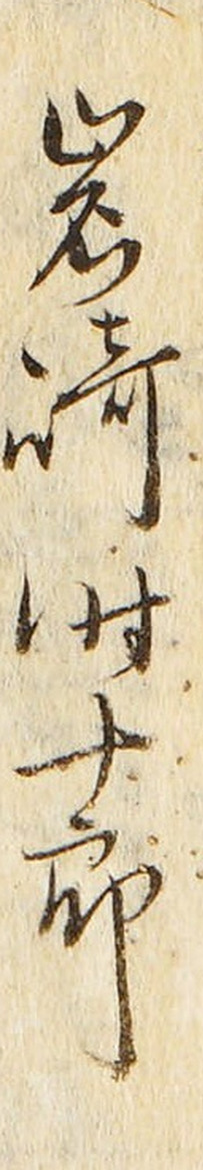岩崎時十郎
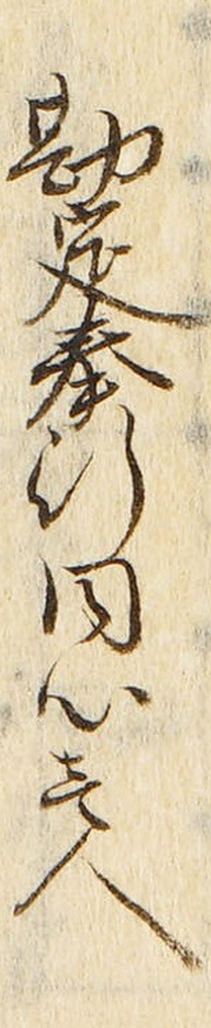勘定奉行同心壱人
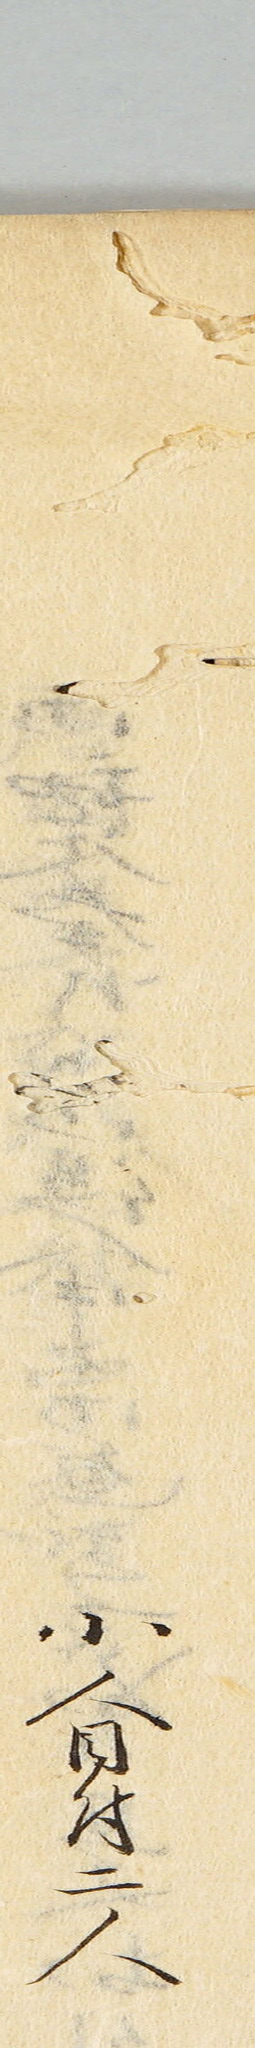小人目付二人
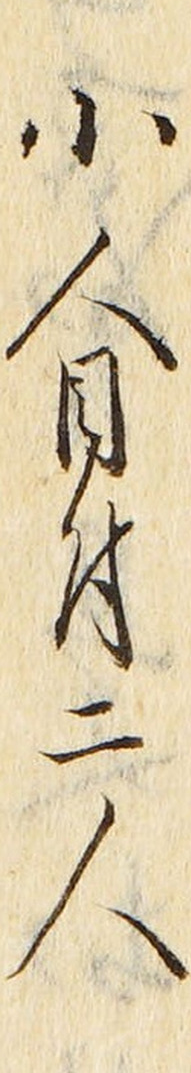小人目付二人
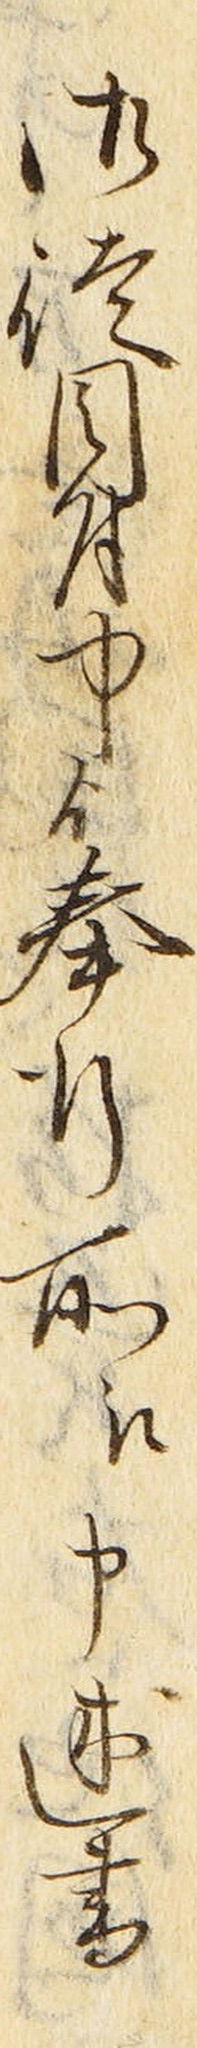御徒目付申ゟ奉行所江申述書
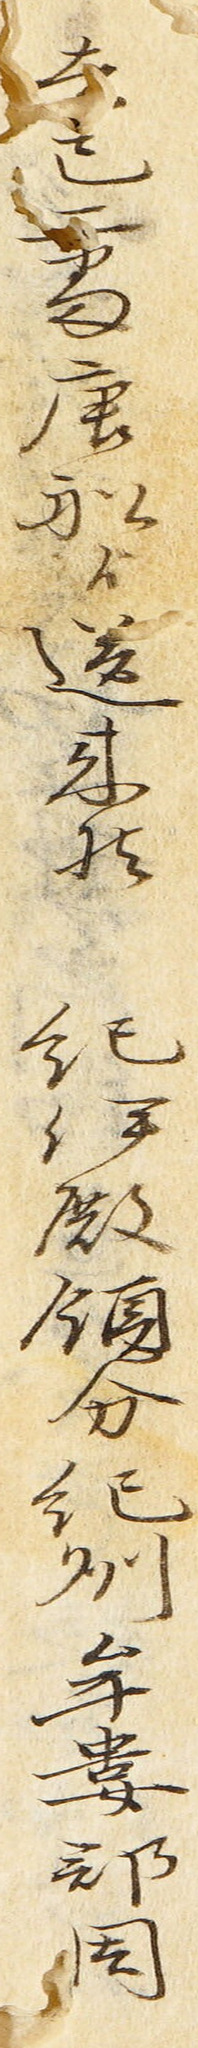左？ニ叟唐船ゟ送来候紀伊殿領分紀州牟婁郡周
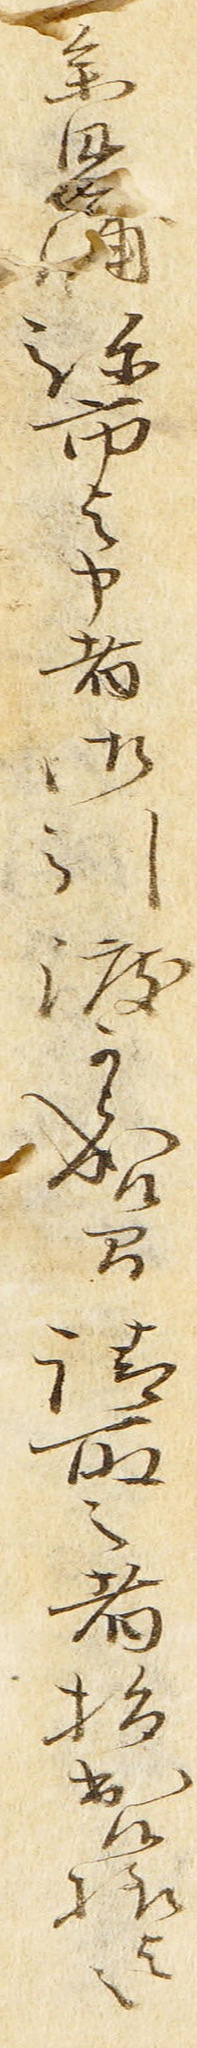余丹ケ浦弥市と申者御引渡可被成候間請取之者指出候様と之
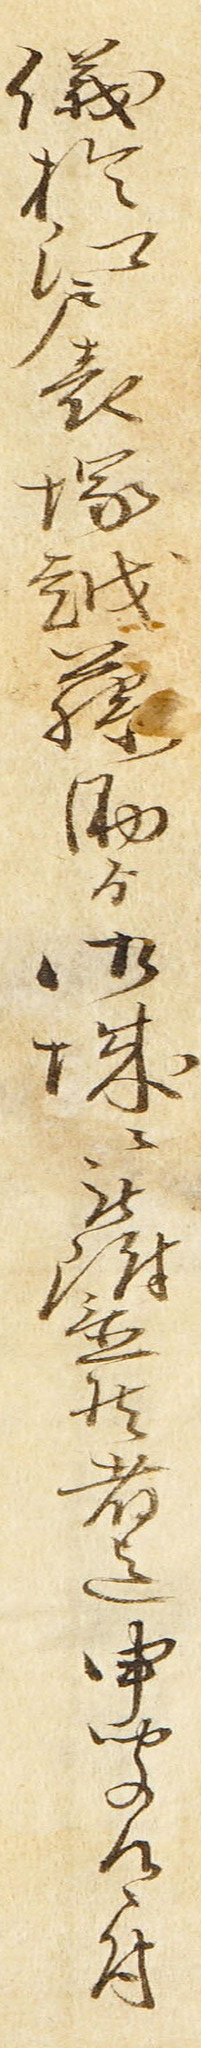儀於江戸表塚越藤助ゟ御城に附置候者迠申聞候に付
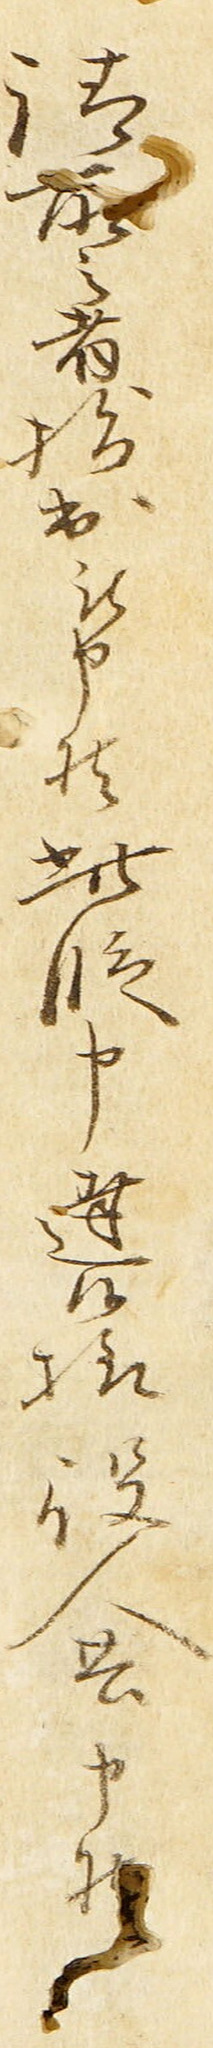請取之者指出被申候此段申達候様役人共申候

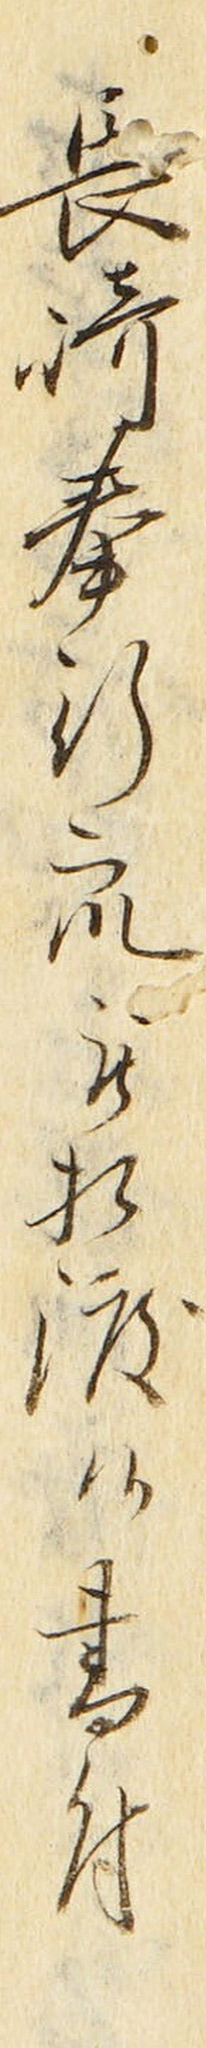長崎奉行衆への相渡候書付
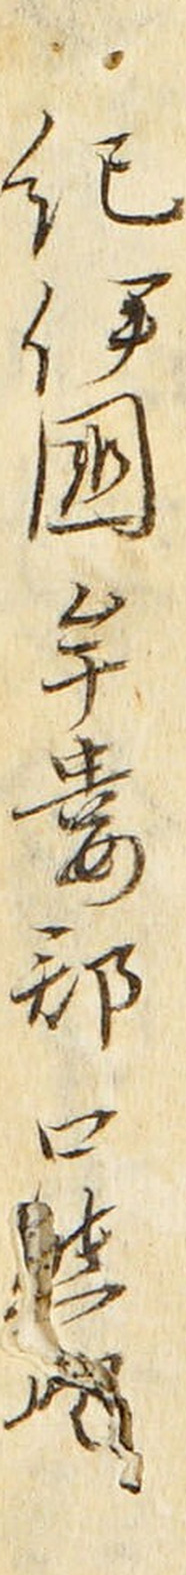紀伊国牟婁郡口然習
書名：漂流人弥市之記
